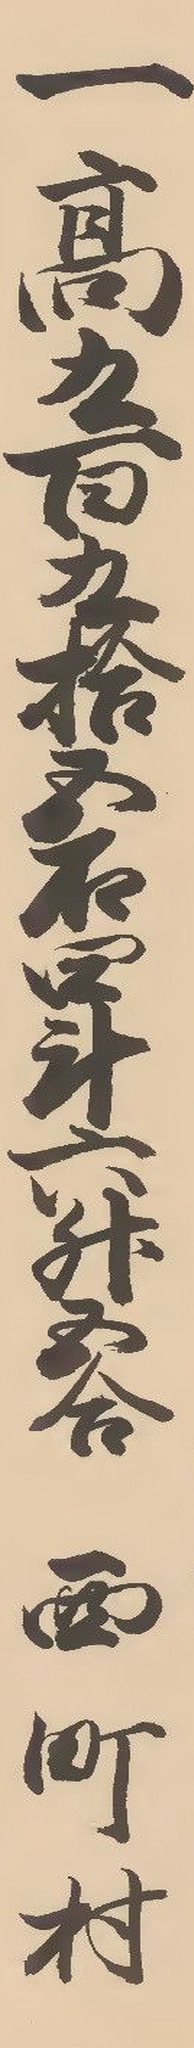一高九百九拾五石四斗六升五合西町村
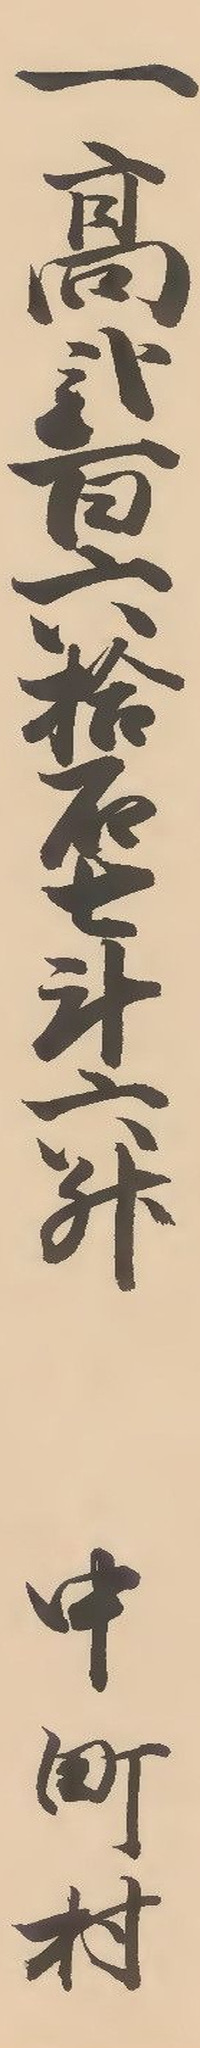一高弐百六拾石七斗六升中町村
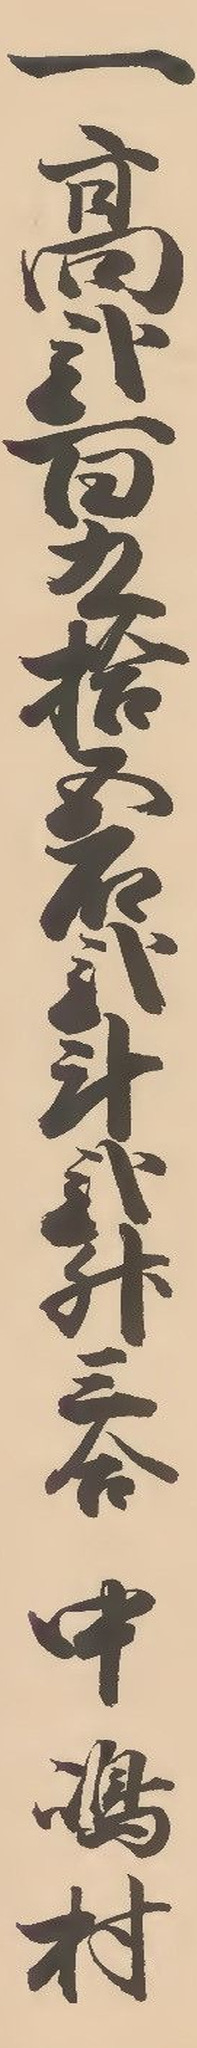一高弐百九拾五石弐斗弐升三合中島村
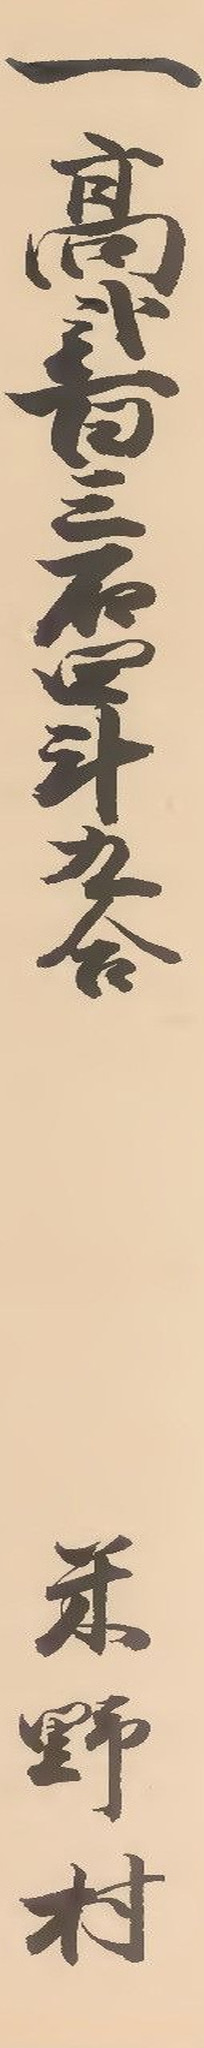一高弐百三石四斗九合米野村
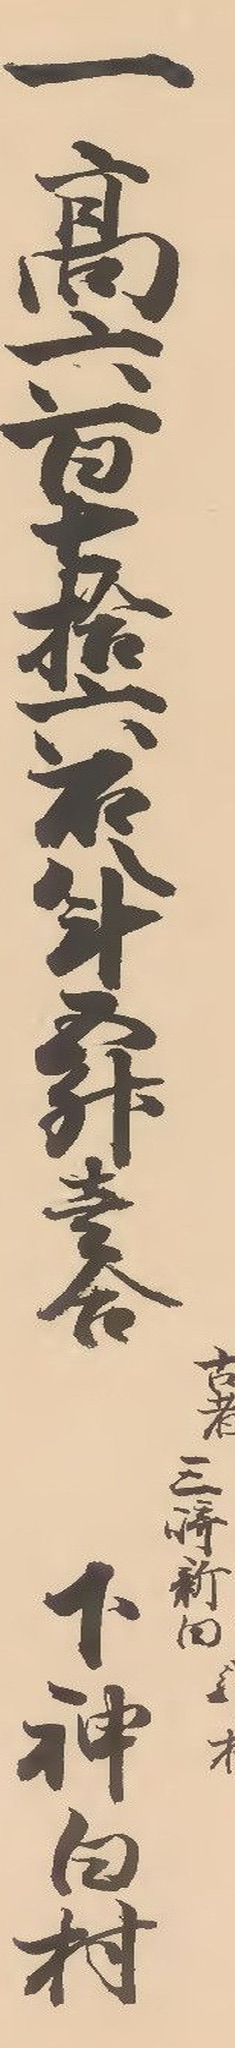一高六百七拾六石八斗五升壱合下神白村
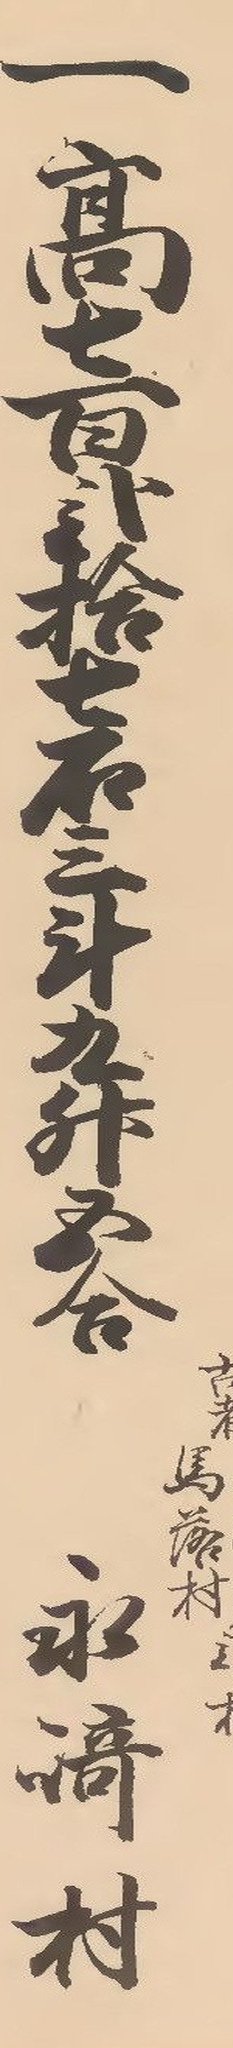一高七百弐拾七石三斗九升五合永崎村
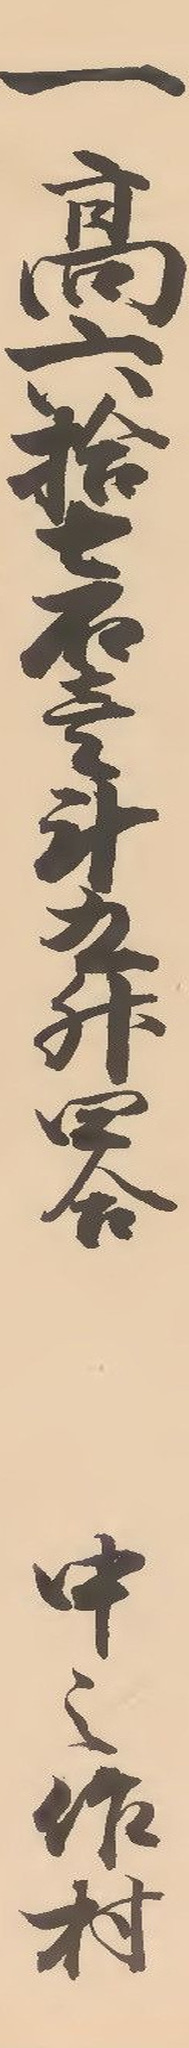一高六拾七石壱斗九升四合中之作村

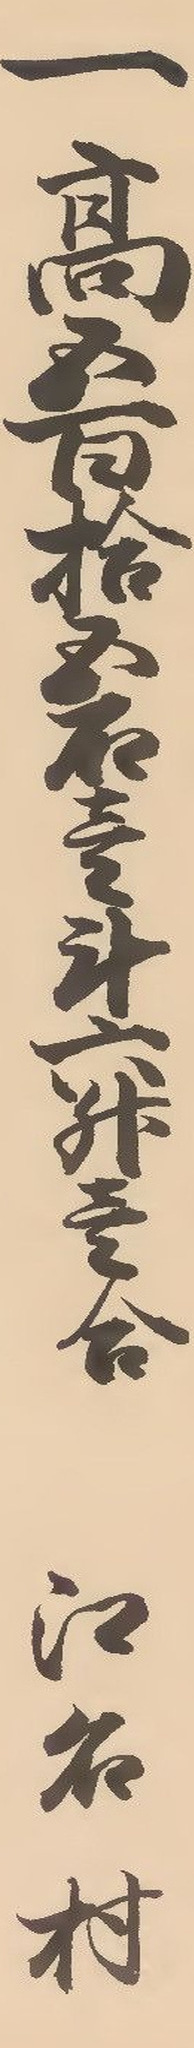一高五百拾五石壱斗六升壱合江名村
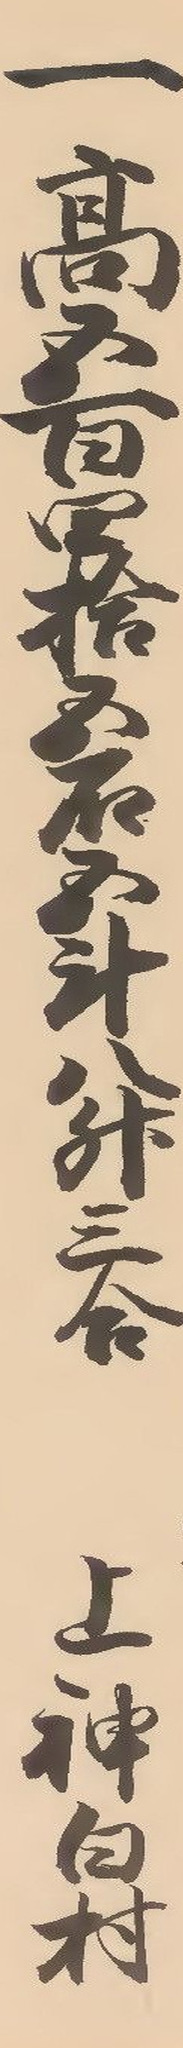一高五百四拾五石五斗八升三合上神白村
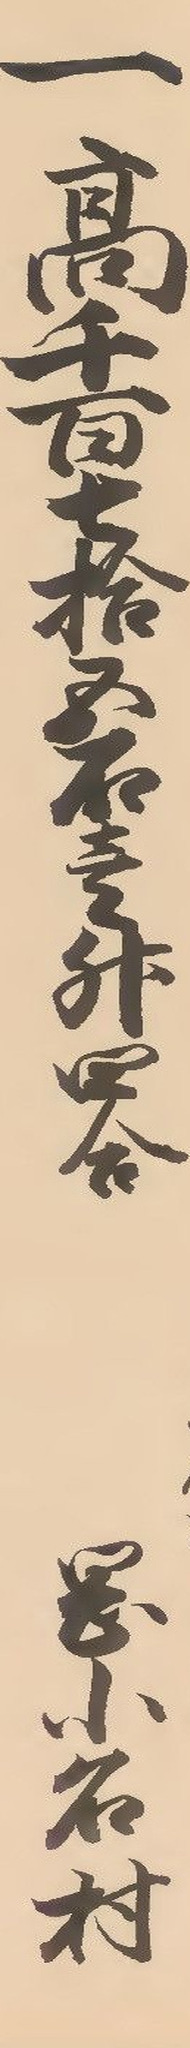一高千百七拾五石壱升四合岡小名村
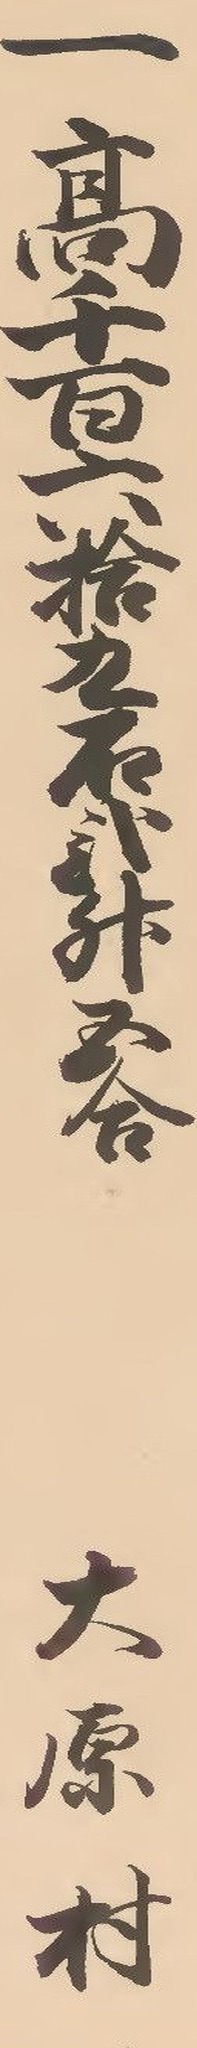一高千百六拾九石弐升五合大原村
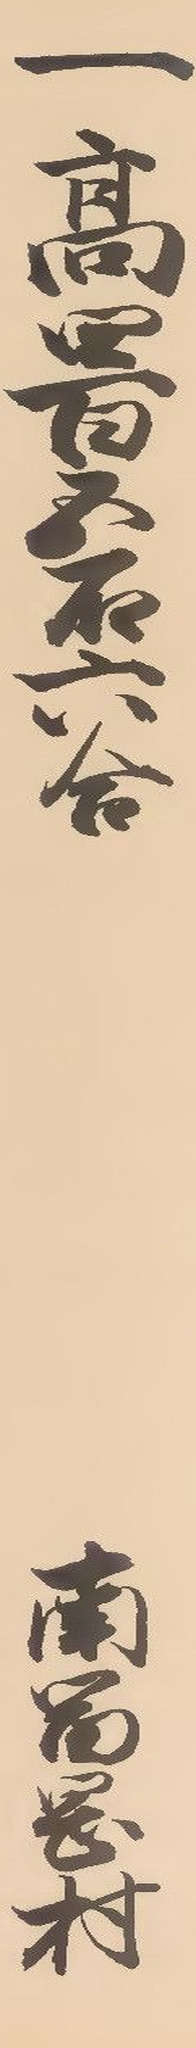一高四百五石六合南富岡村
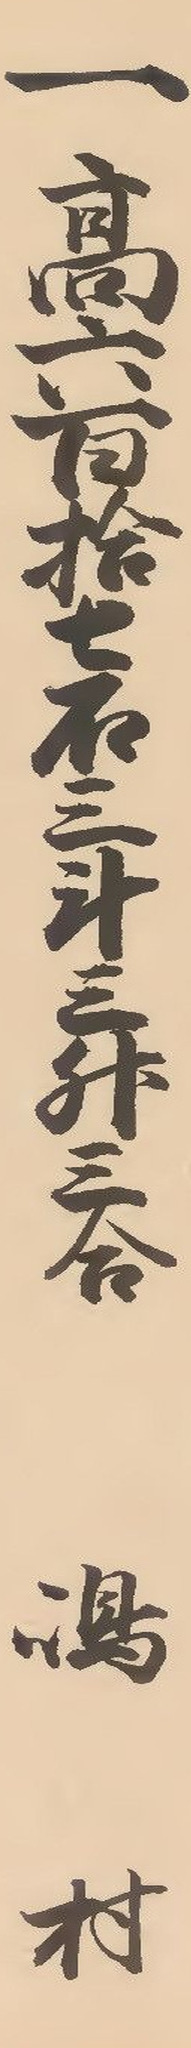一高六百拾七石三斗三升三合島村
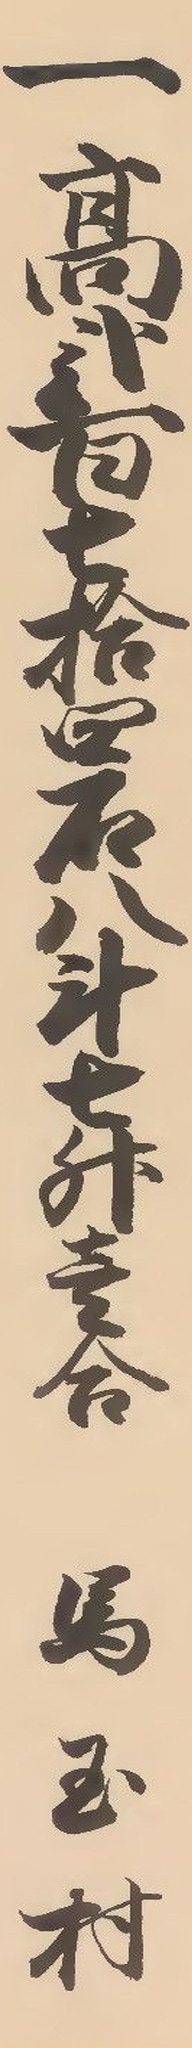一高弐百七拾四石八斗七升壱合馬玉村
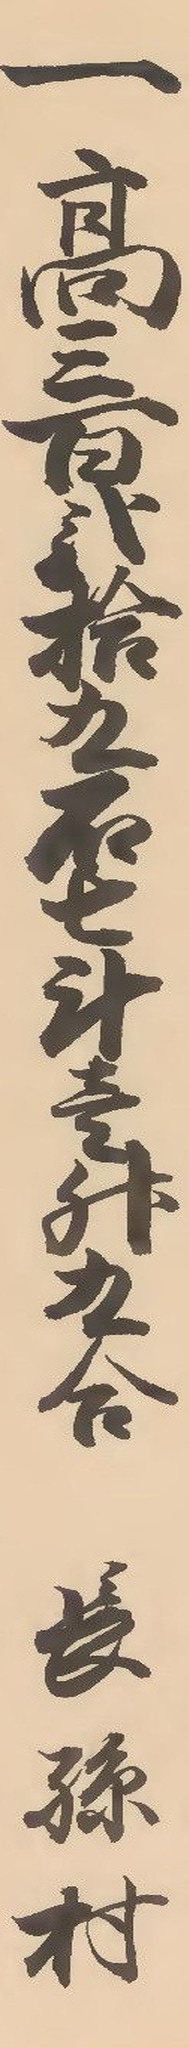一高三百弐拾九石七斗壱升九合長孫村

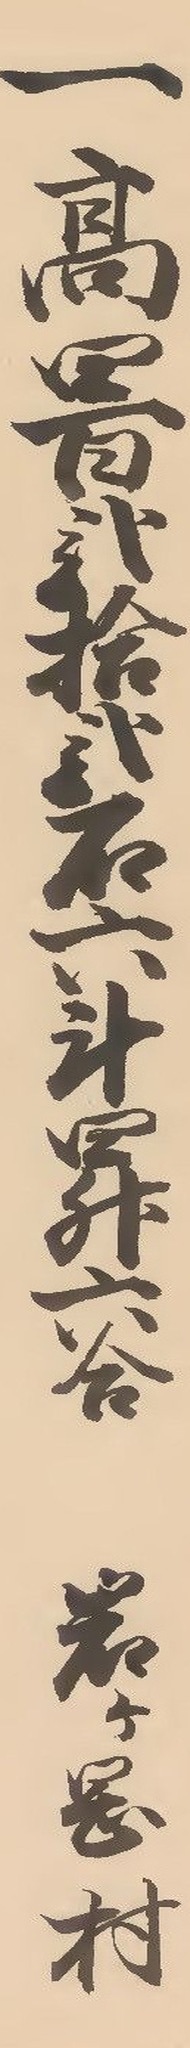一高四百弐拾弐石六斗四升六合岩ヶ岡村
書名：陸奥国郷帳　３
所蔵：国立公文書館 National Archives of Japan
